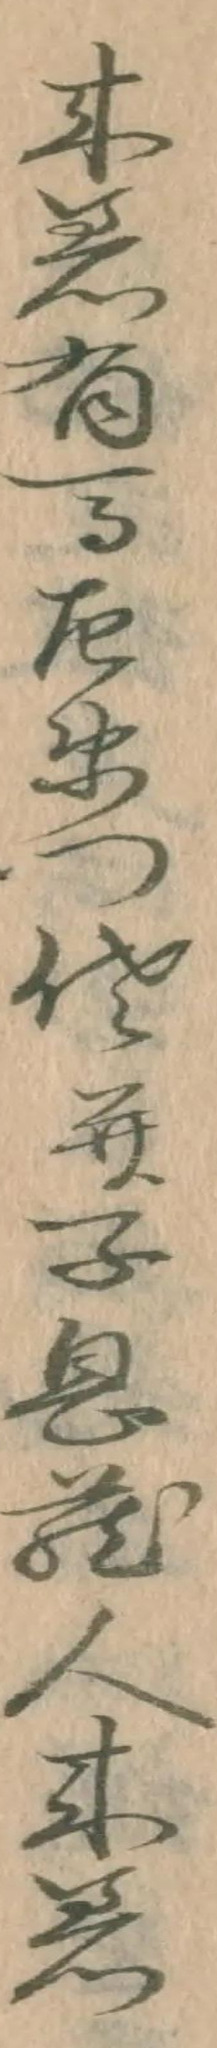来着有馬左衛門佐幷子息蔵人来着
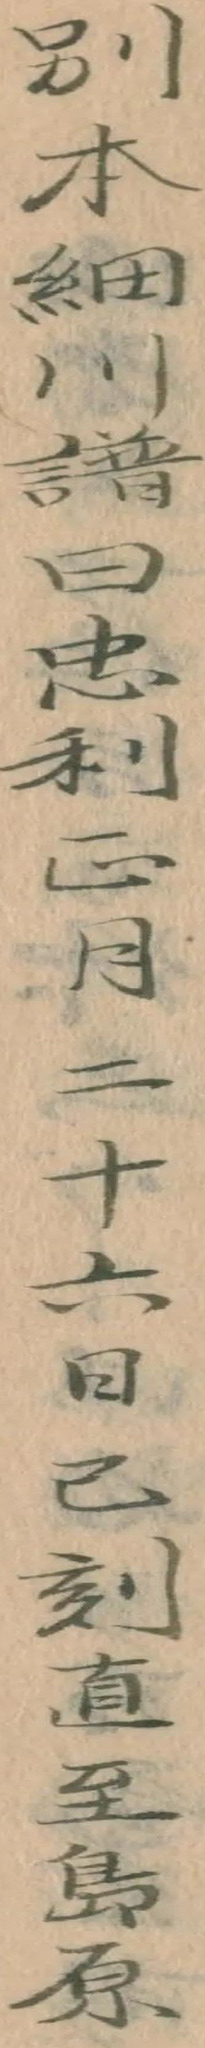別本細川譜曰忠利正月二十六日己刻直至島原
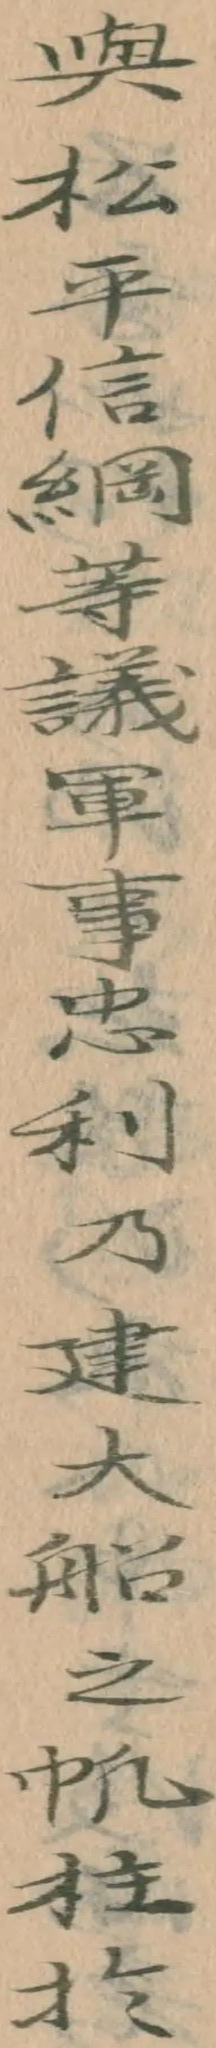與松平信綱等議軍事忠利乃建大舩之帆柱於
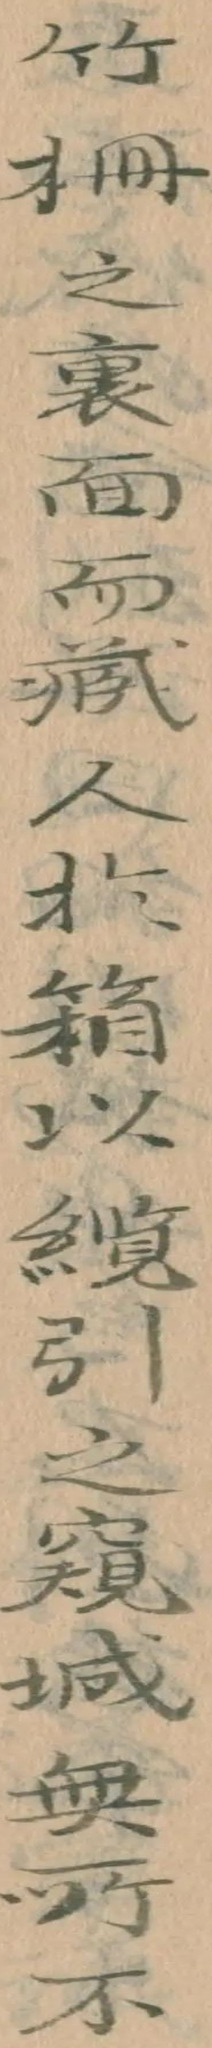竹柵之裏面而蔵人於箱以纜引之窺域無所不
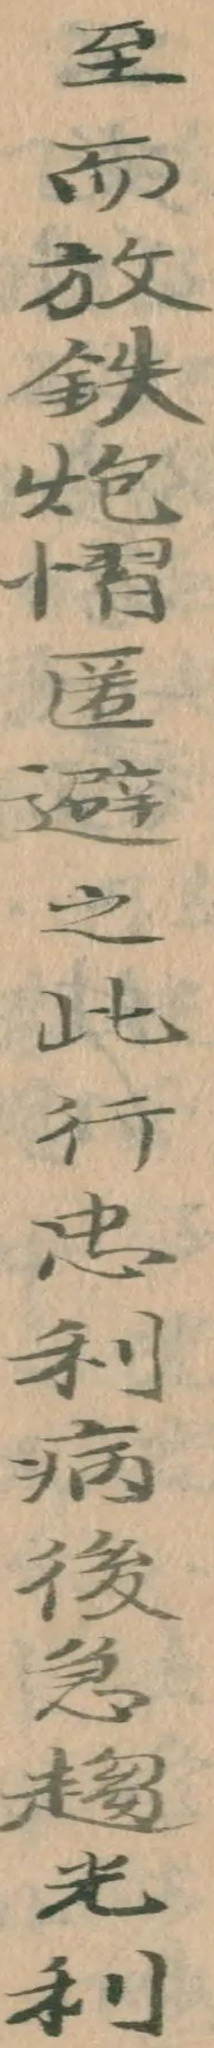至而放鉄炮慴匿避之此行忠利病後急趨光利
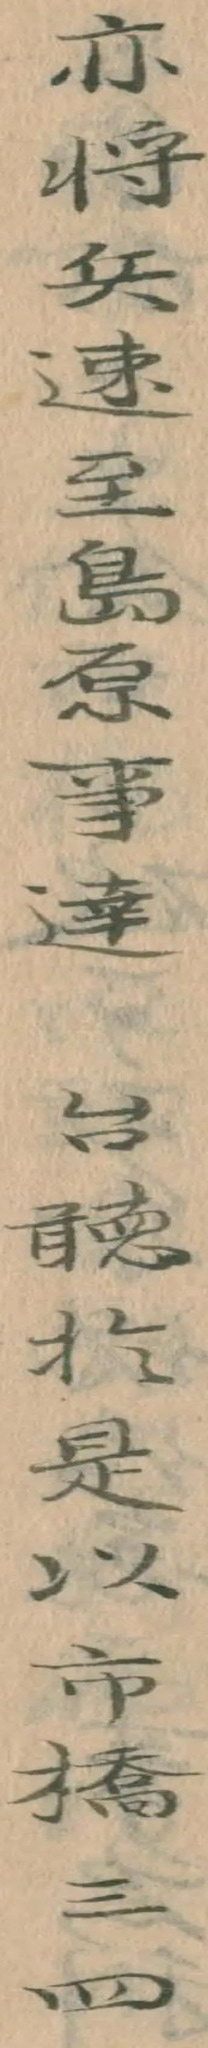亦将兵速至島原事達台聴於是以市橋三四
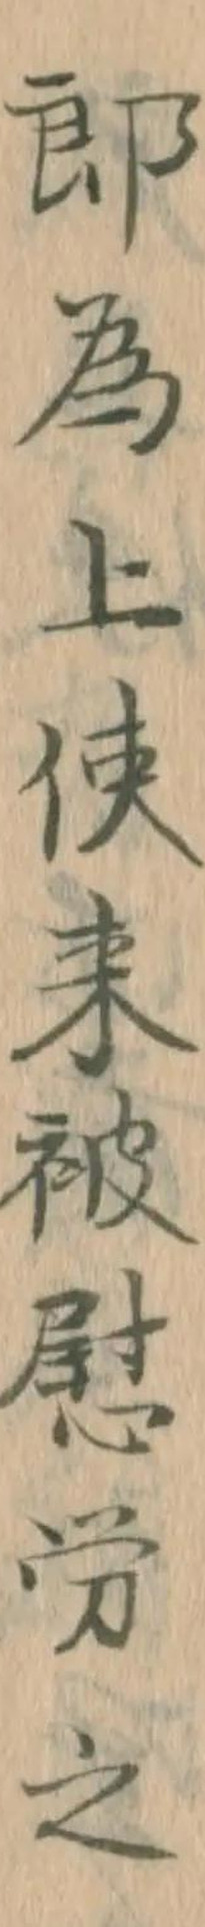郎為上使来被慰労之
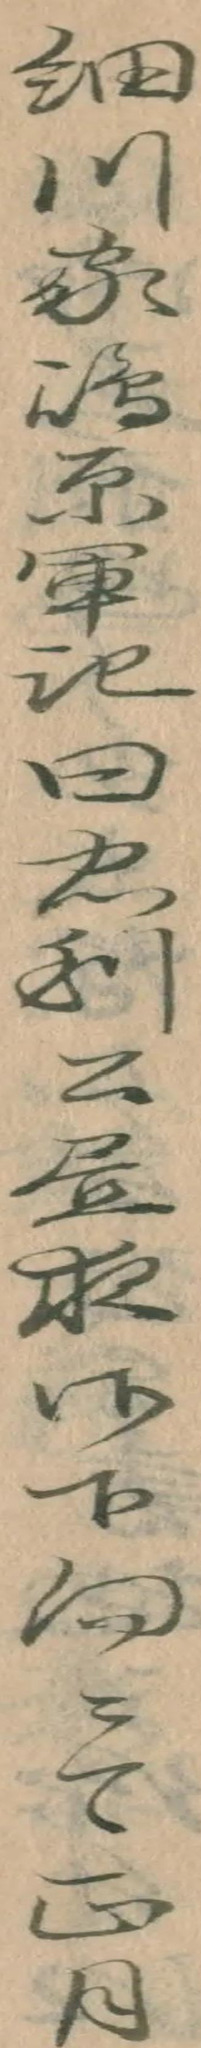細川家嶋原軍記曰忠利公昼夜御下向にて正月
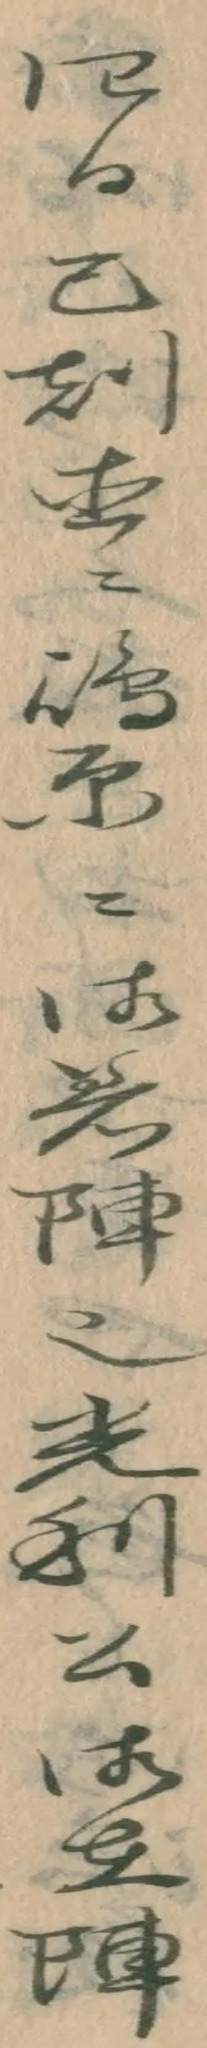四日巳刻直に島原に御着陣也光利公御在陣
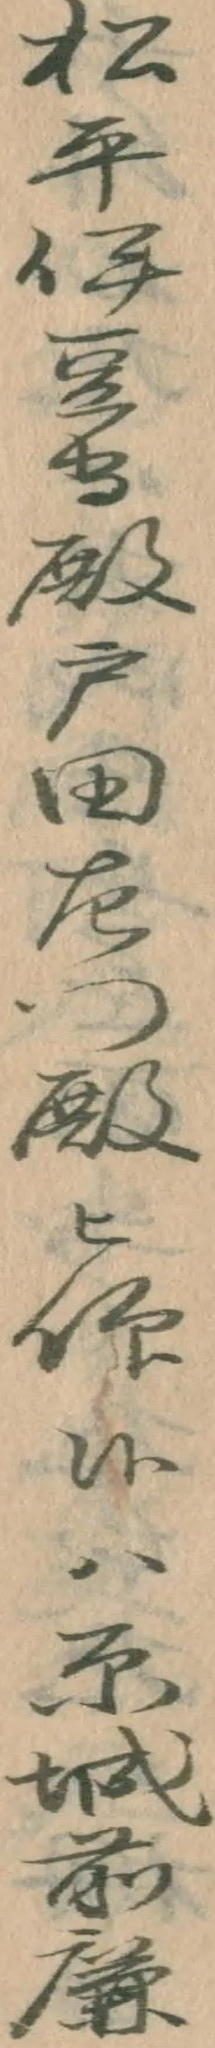松平伊豆守殿戸田左門殿被仰候は原城前廉
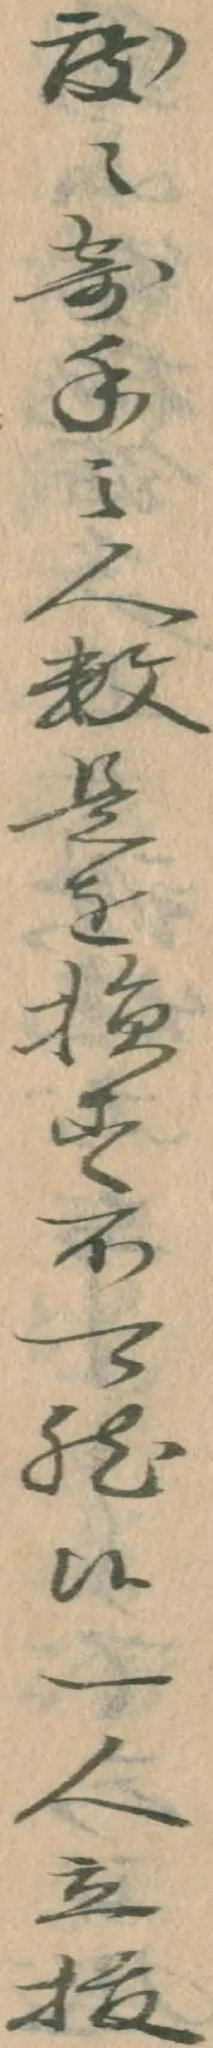度之寄手之人数是を損春不可然候一人立抜
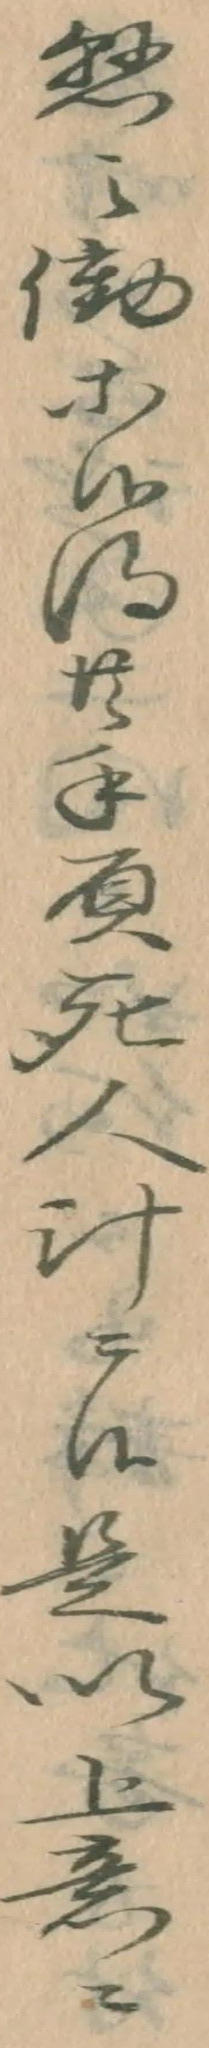懸之働等候得共手負死人計に候是以上意に

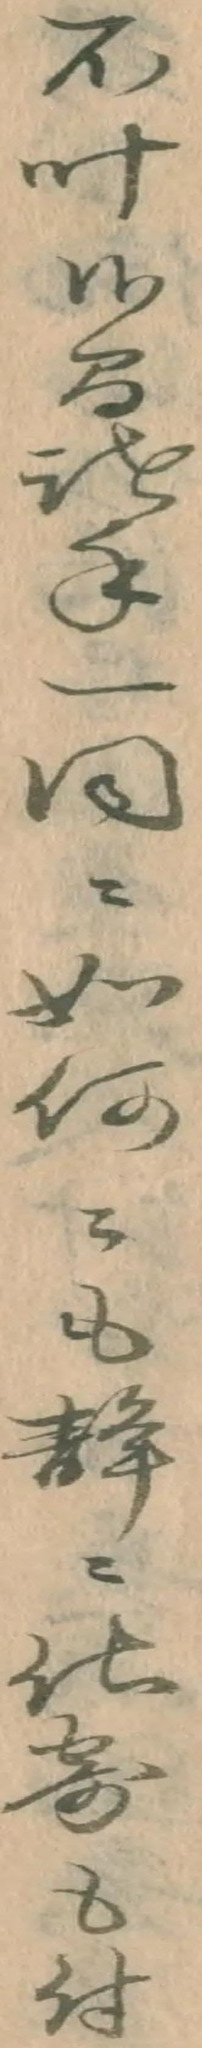不叶候間諸手一同に如何にも静に仕寄も付
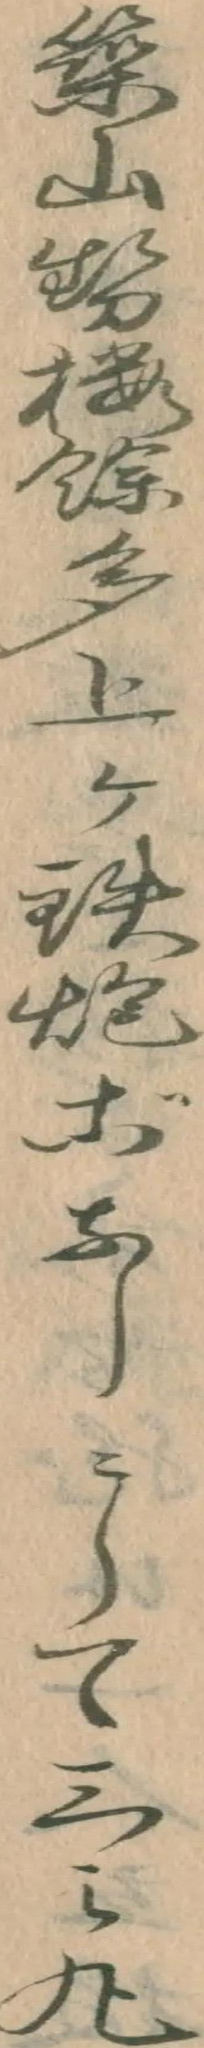築山勢揃余多上け鉄炮等なしにして三之丸
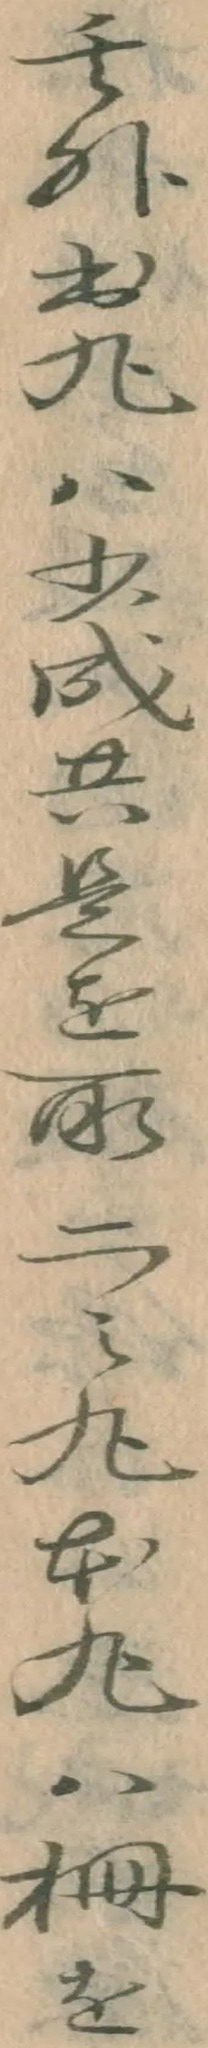其外出丸は少成共是を取二之丸本丸は柵を
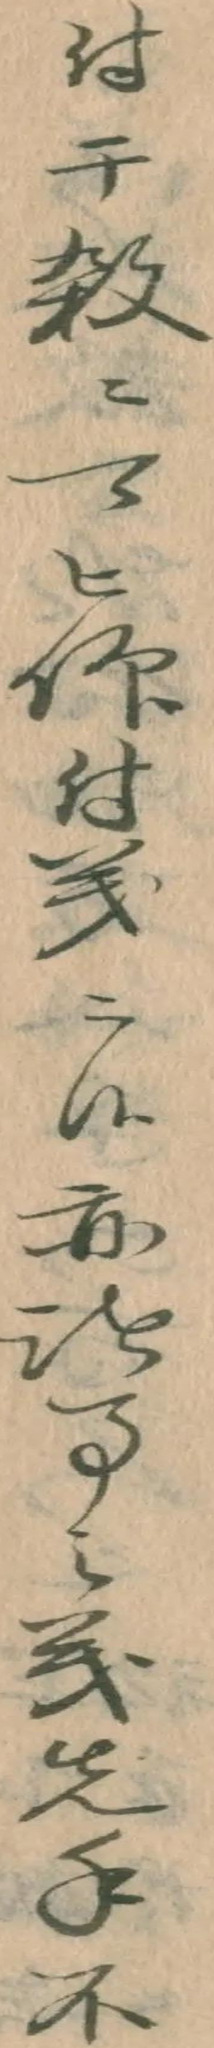付干殺に可被仰付義に候亦諸事之義先手不
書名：切支丹御退治記 49巻. [6]
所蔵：国立国会図書館 National Diet Library, JAPAN
